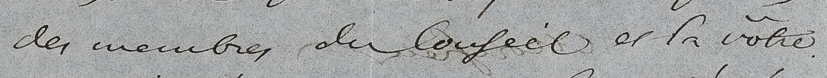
des membres du Conseil et la vôtre.
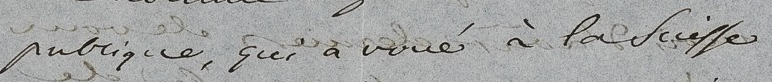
publique, qui a voué à la Suisse
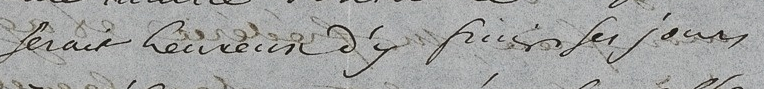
serait heureux d'y finir ses jours.
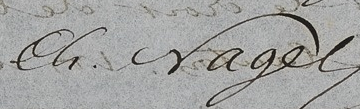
Ch. Nagel
